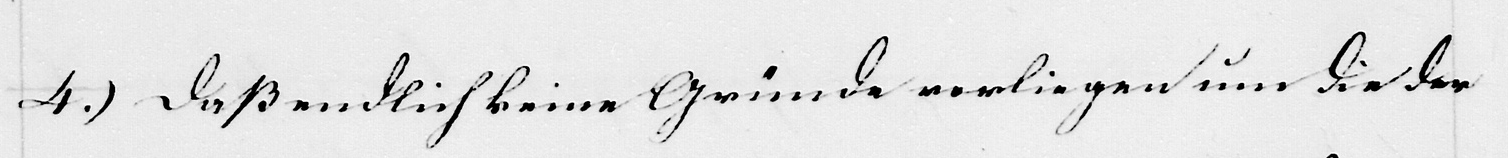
4.) Daß endlich keine Gründe vorliegen um die der
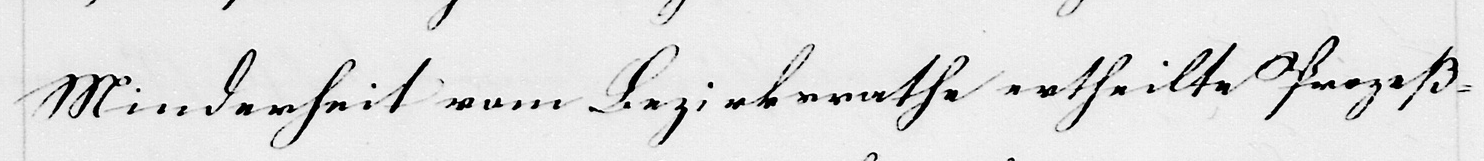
Minderheit vom Bezirksrathe ertheilte Prozeß¬
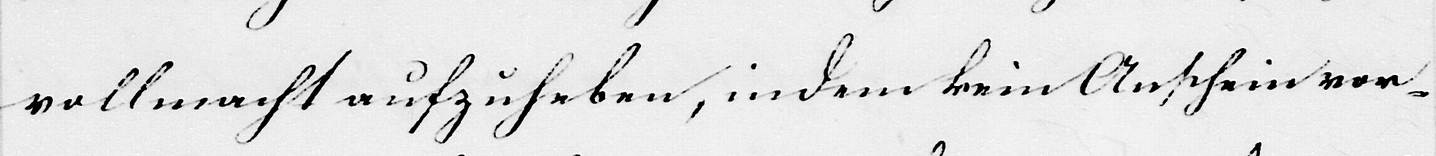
vollmacht aufzuheben, indem kein Anschein vor¬
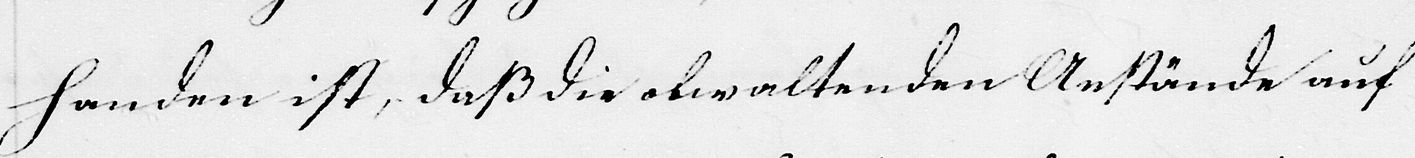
handen ist, daß die obwaltenden Anstände auf
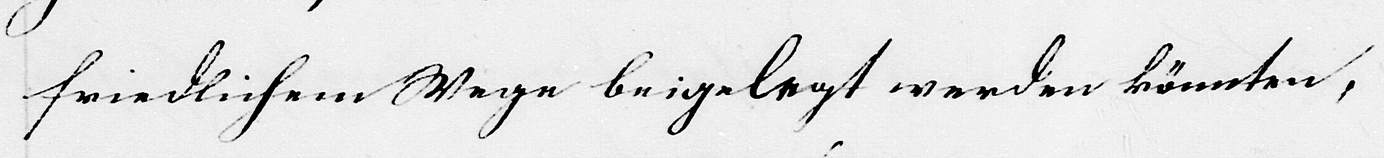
friedlichem Wege beigelegt werden könnten,
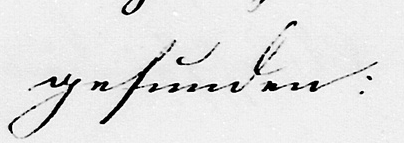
gefunden:
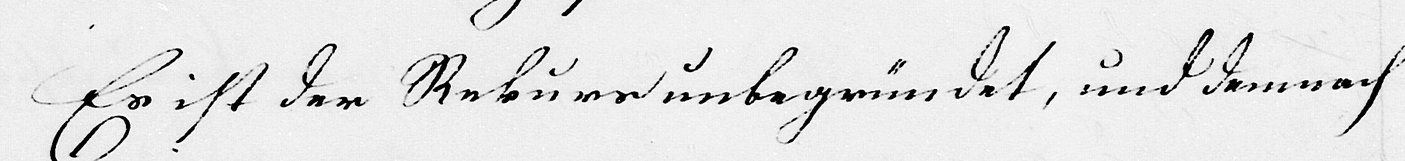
Es ist der Rekurs unbegründet, und demnach
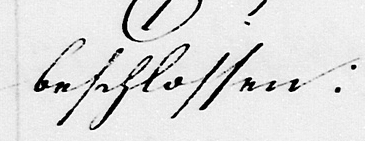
beschlossen:
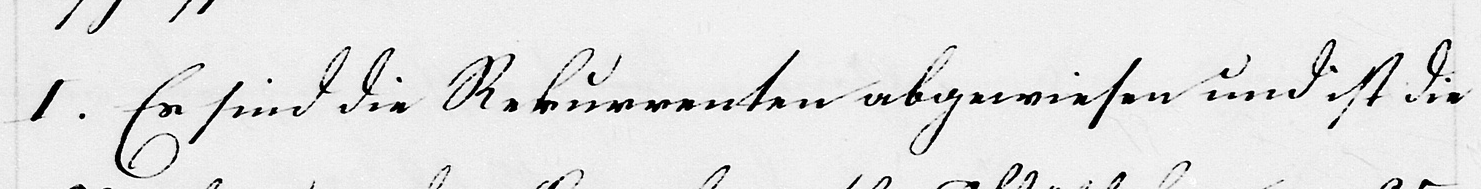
I. Es sind die Rekurrenten abgewiesen und ist die
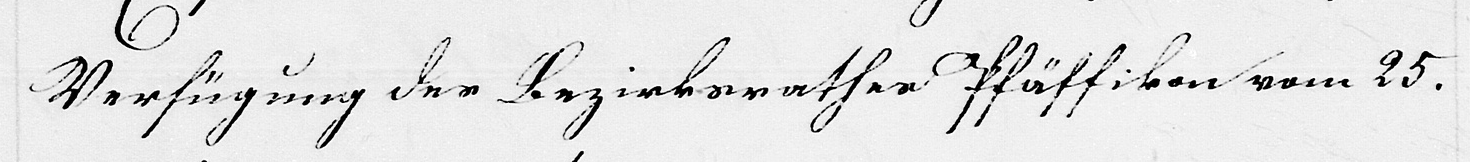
Verfügung des Bezirksrathes Pfäffikon vom 25.
